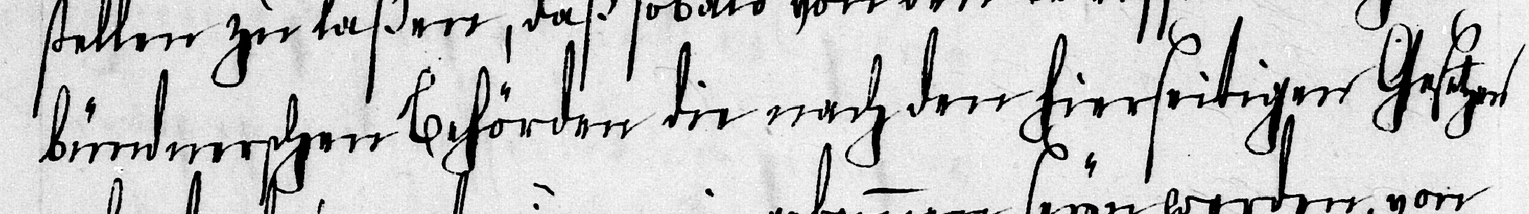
bündnerschen Behörden die nach den hierseitigen Gesetz¬
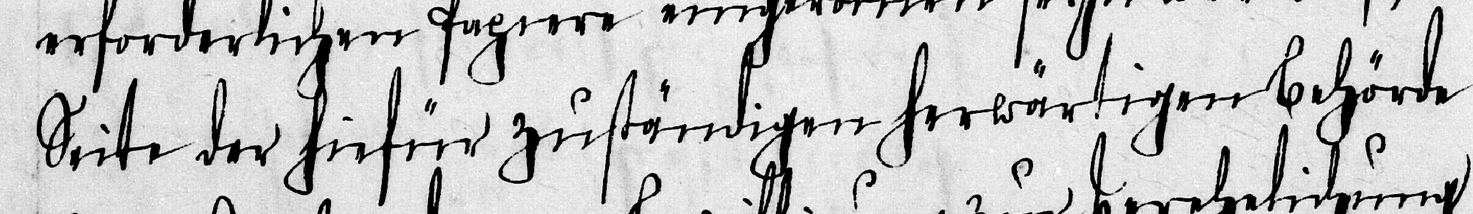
Seite der hiefür zuständigen herwärtigen Behörde
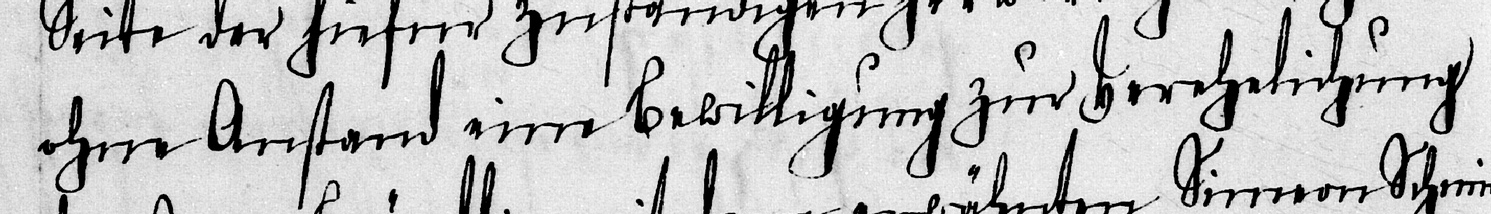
ohne Anstand eine Bewilligung zur Verehelichung
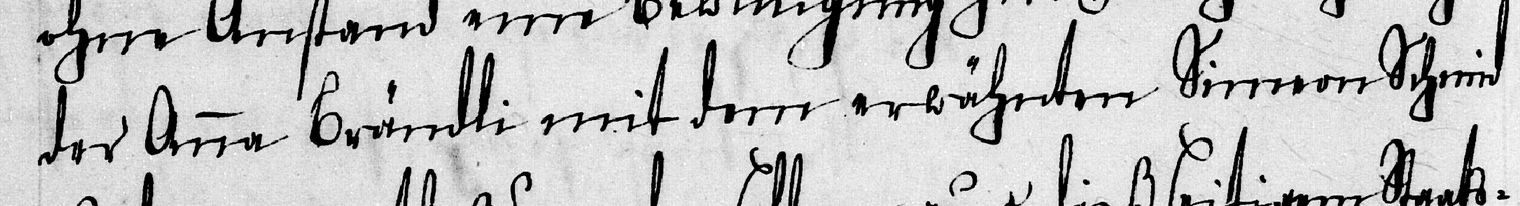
der Anna Brändli mit dem erwähnten Simeon Schmid
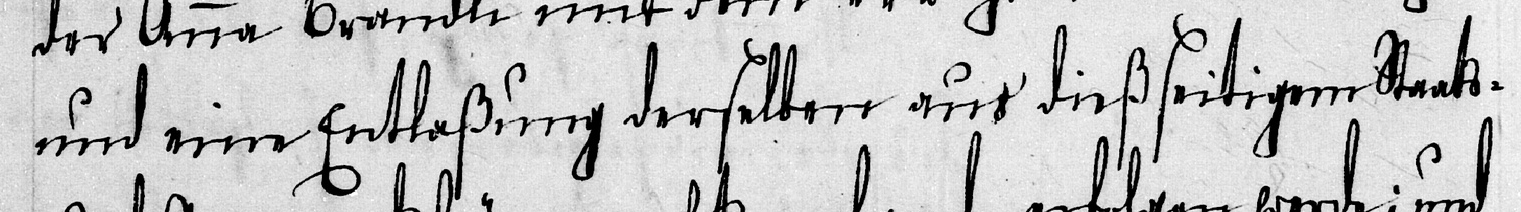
und eine Entlaßung derselben aus dießseitigem Staats-
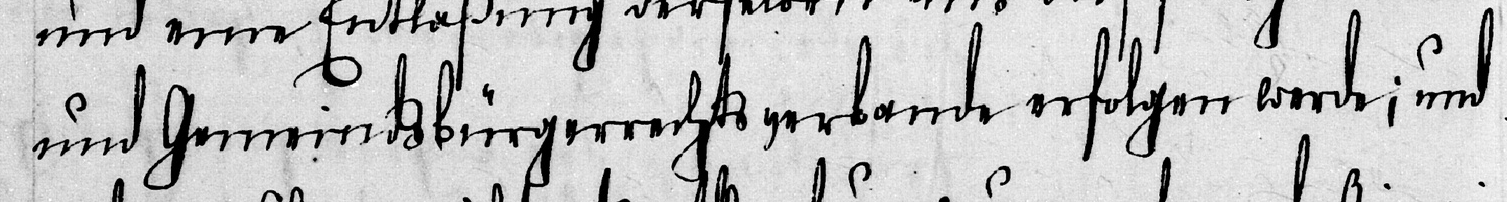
und Gemeindsbürgerrechtsverbande erfolgen werde; und
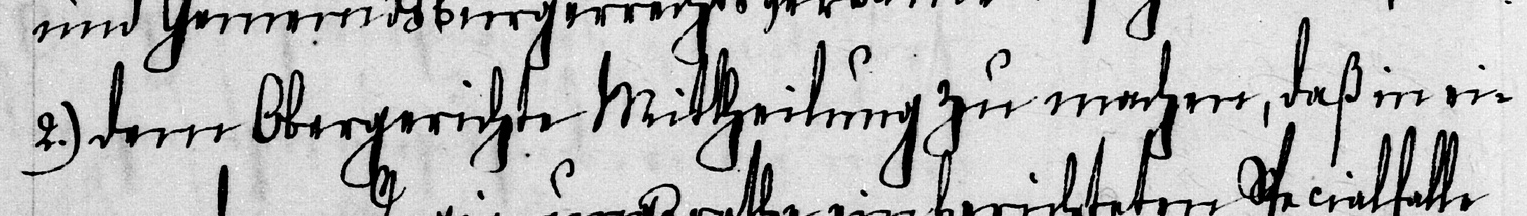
2.) dem Obergerichte Mittheilung zu machen, daß in ein¬
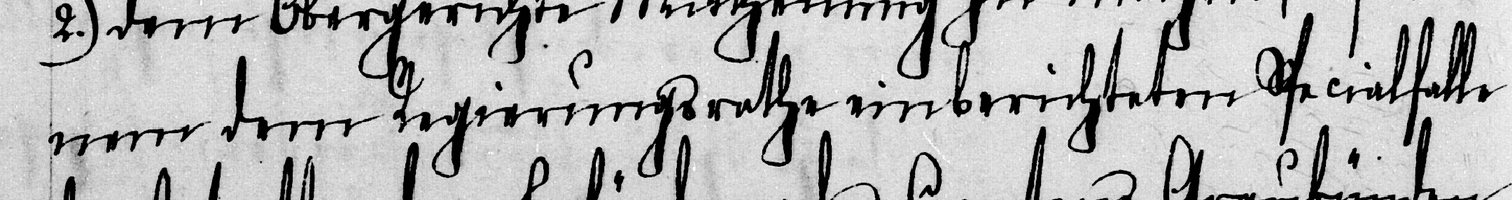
em dem Regierungsrathe einberichteten Specialfalle
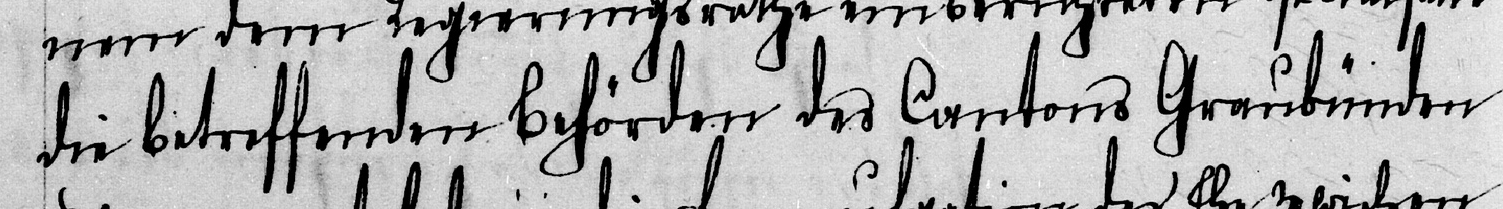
die betreffenden Behörden des Cantons Graubünden
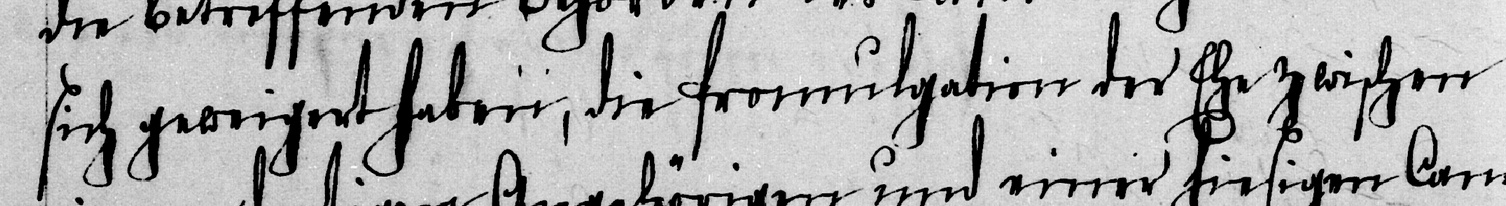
sich geweigert haben die Promulgation der Ehe zwischen
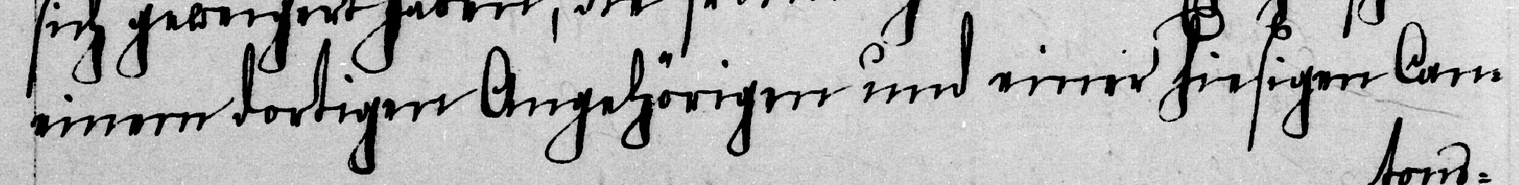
einem dortigen Angehörigen und einer hiesigen Can-
